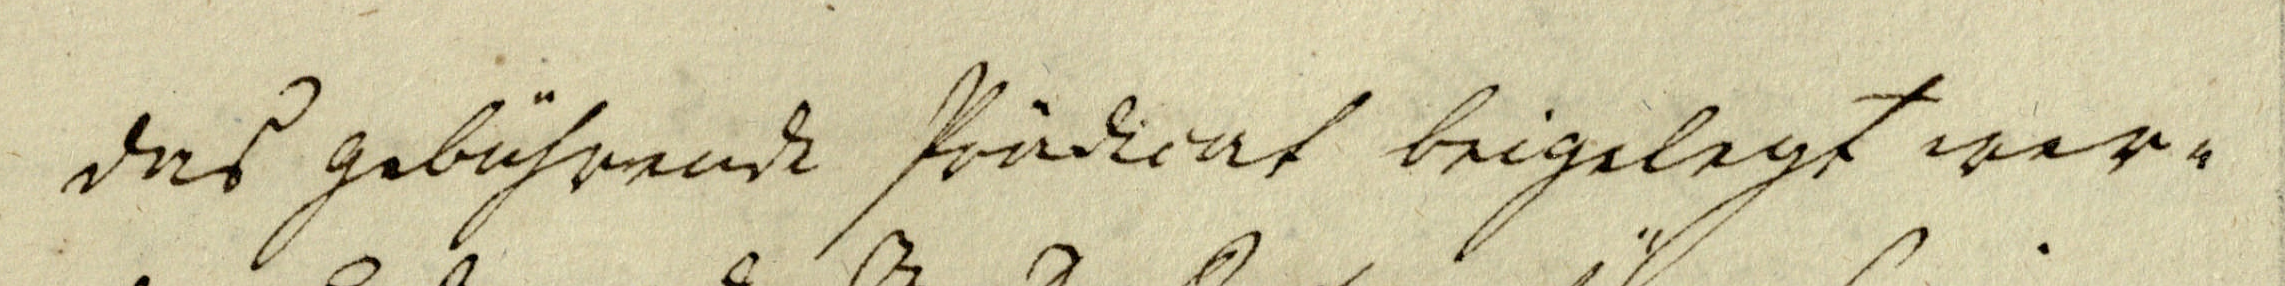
das gebührende Prädicat beigelegt wer¬
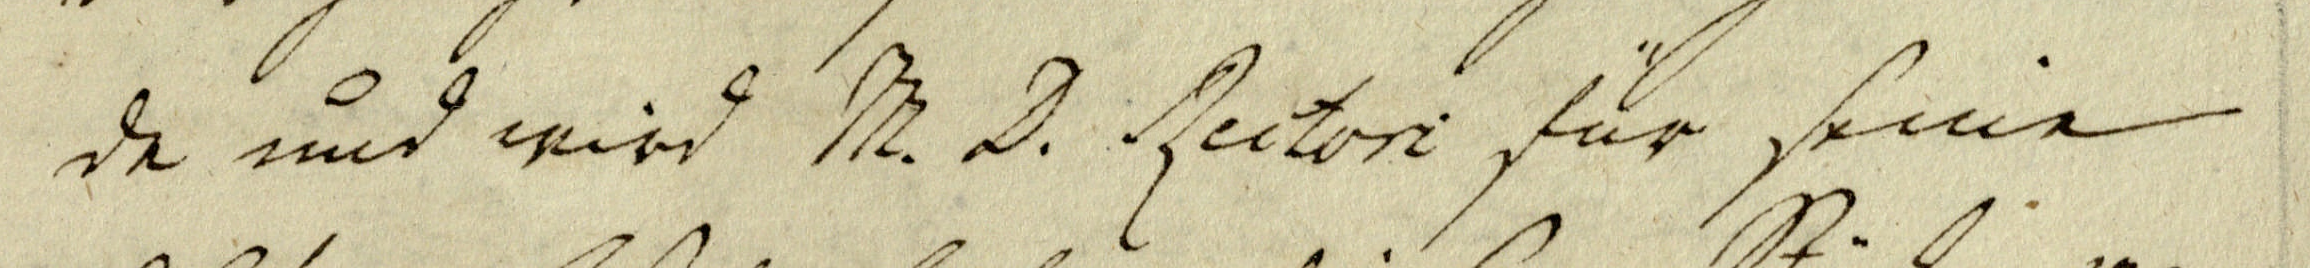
de und wird M. D. Rectori für seine
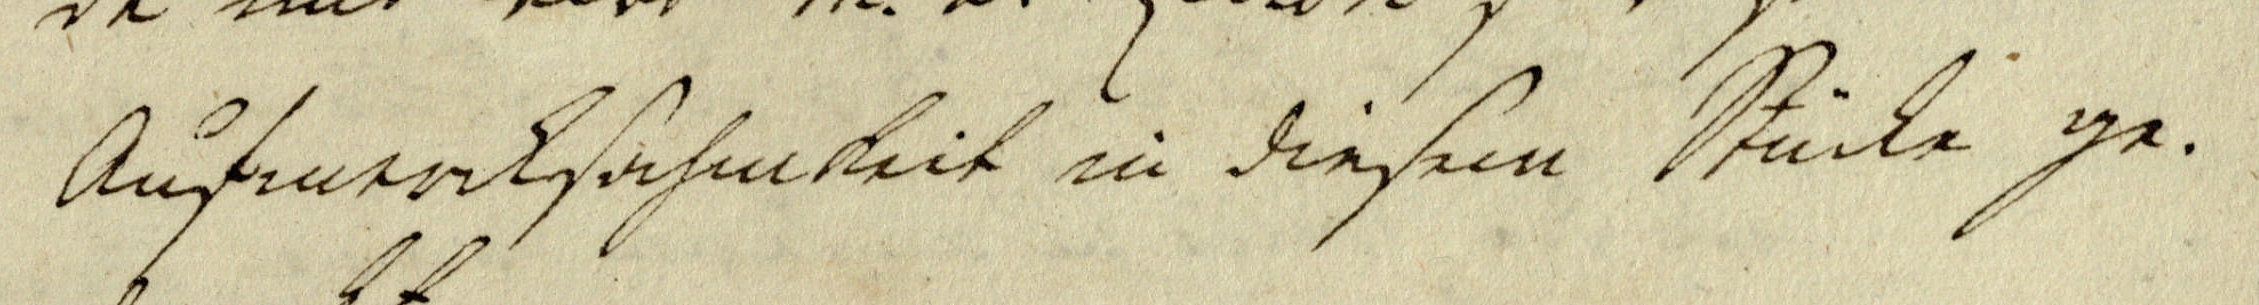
Aufmercksahmkeit in diesen Stücke ge¬
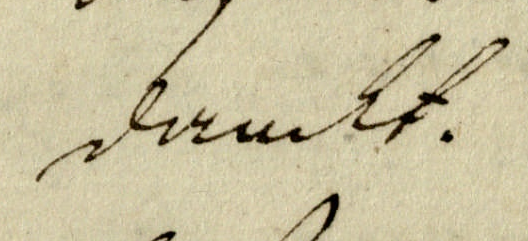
danckt.
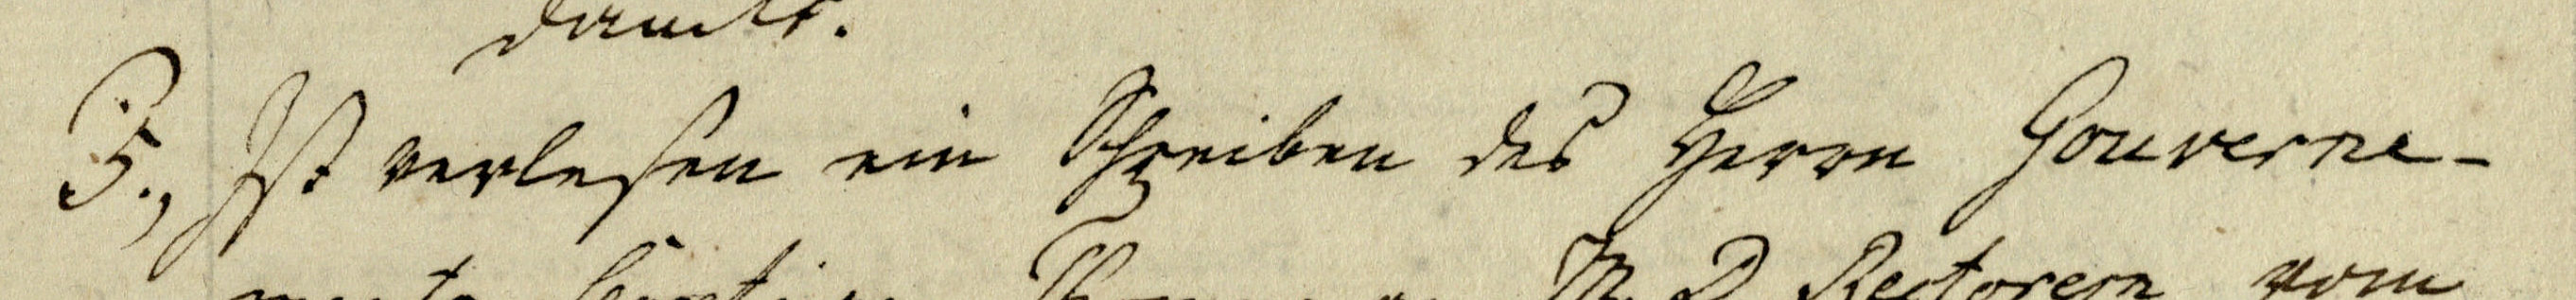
5., Ist verlesen ein Schreiben des Herrn Gouverne¬
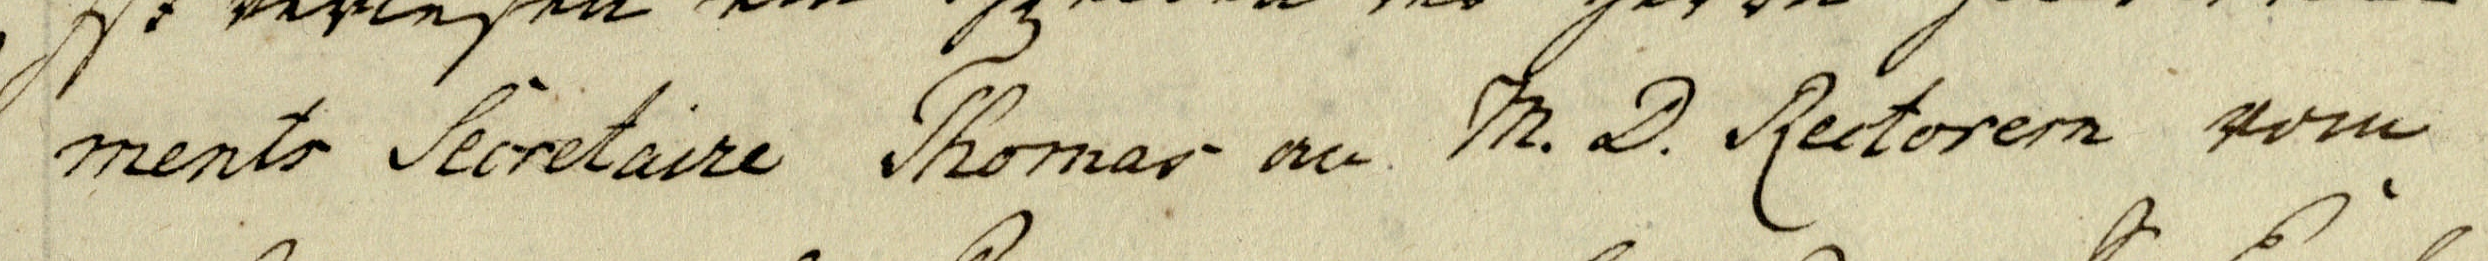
ments Secretaire Thomas an M. D. Rectorem vom
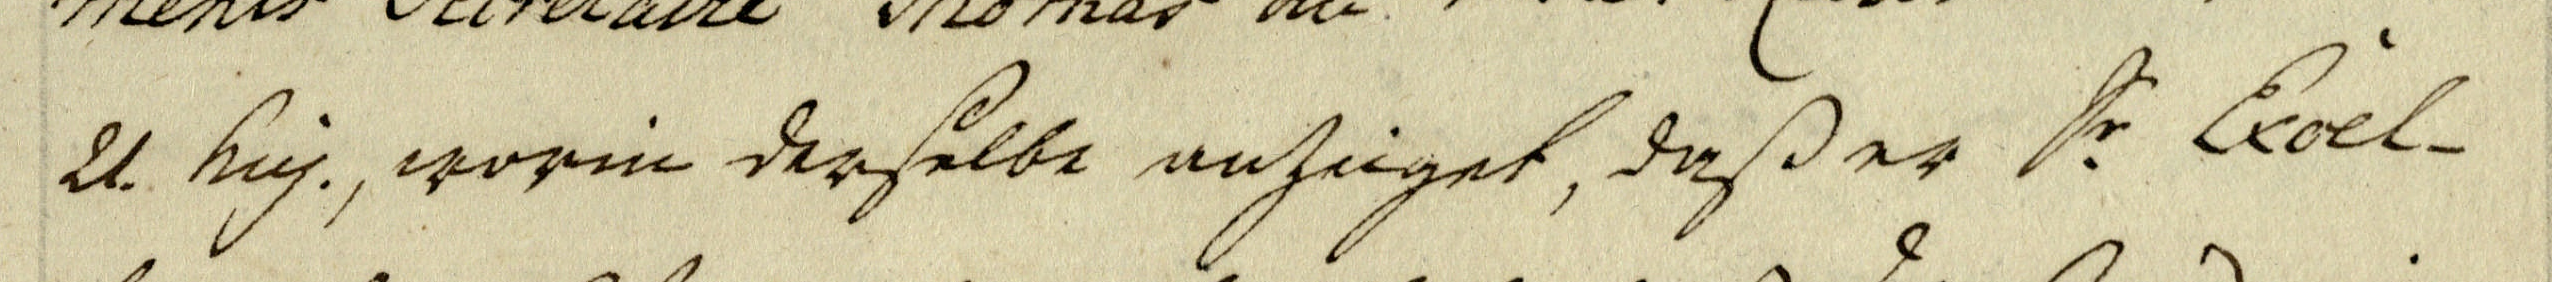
21. huj., worin derselbe anzeiget, daß er Sr Excel¬
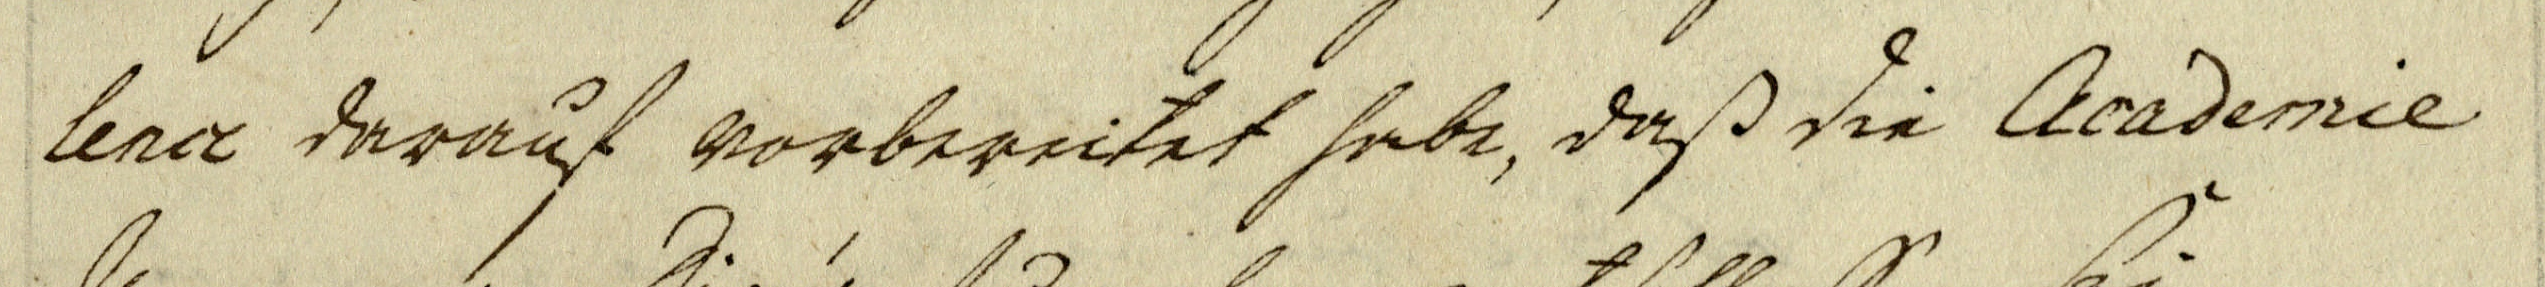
lence darauf vorbereitet habe, daß die Academie
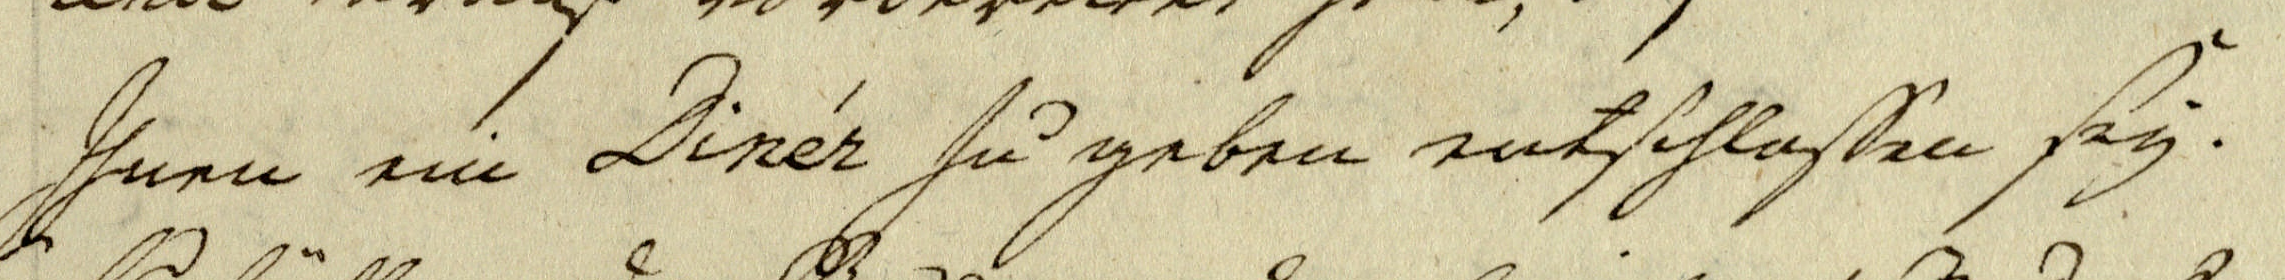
Ihnen ein Dinér zu geben entschlossen seÿ.
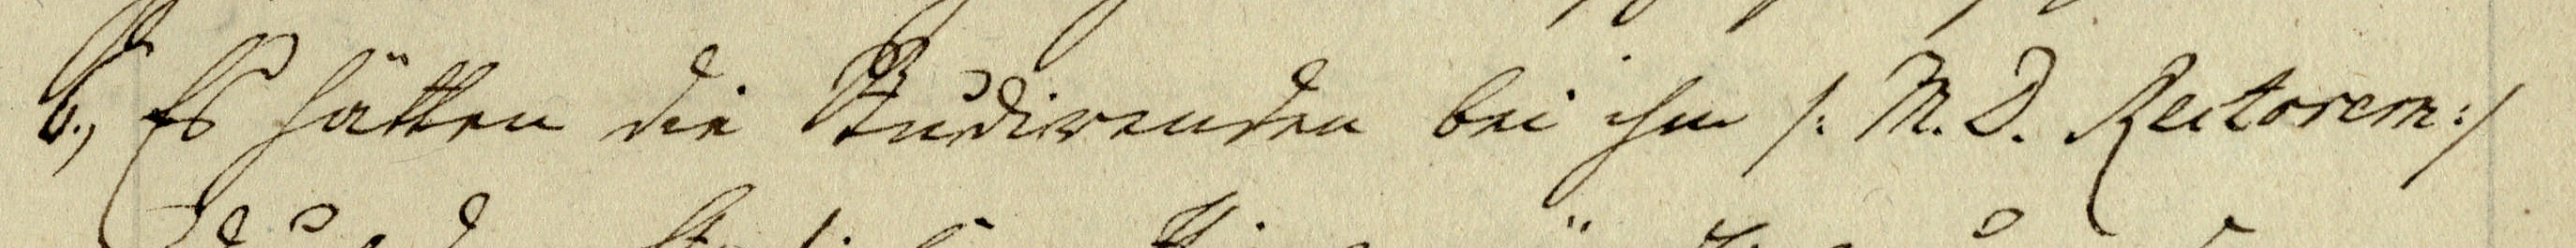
6., Es hätten die Studirenden bei ihm /. M. D. Rectorem :/
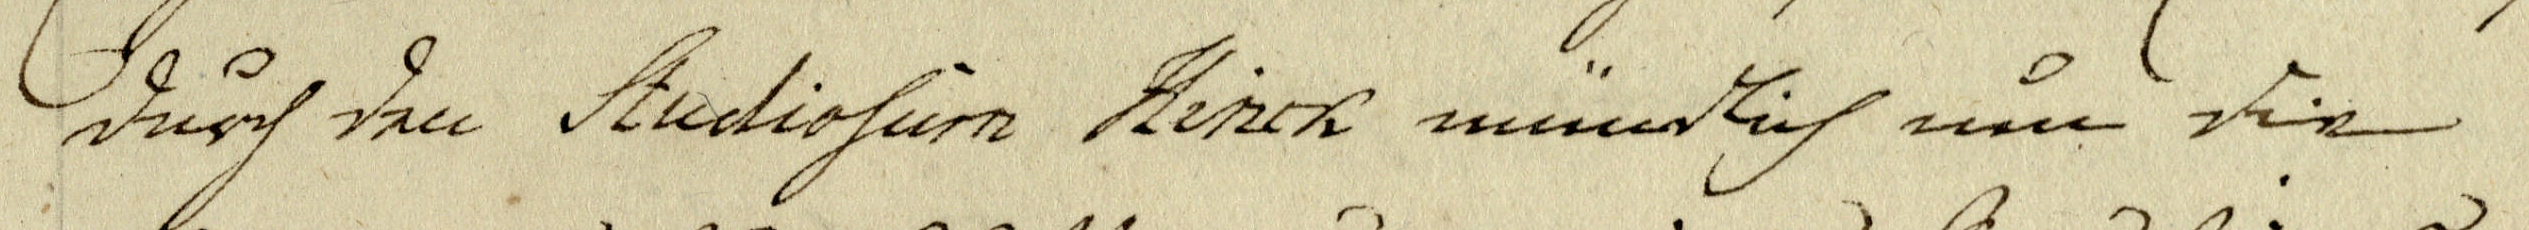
durch den Studiosum Hinck mündlich um die
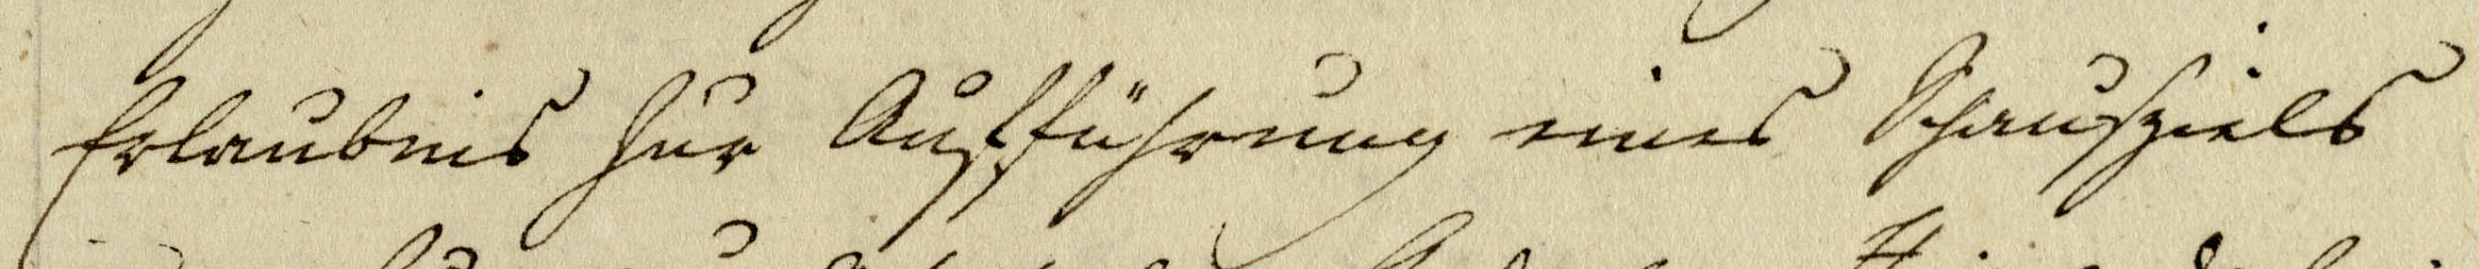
Erlaubnis zur Aufführung eines Schauspiels
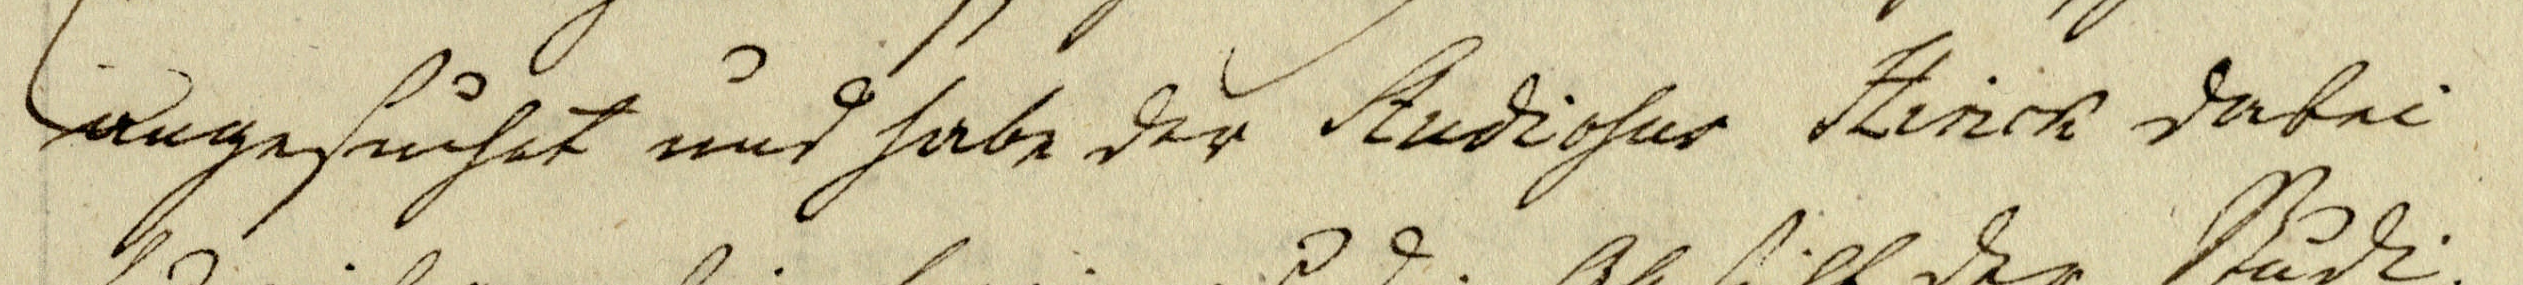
angesuchet und habe der Studiosus Hinck dabei
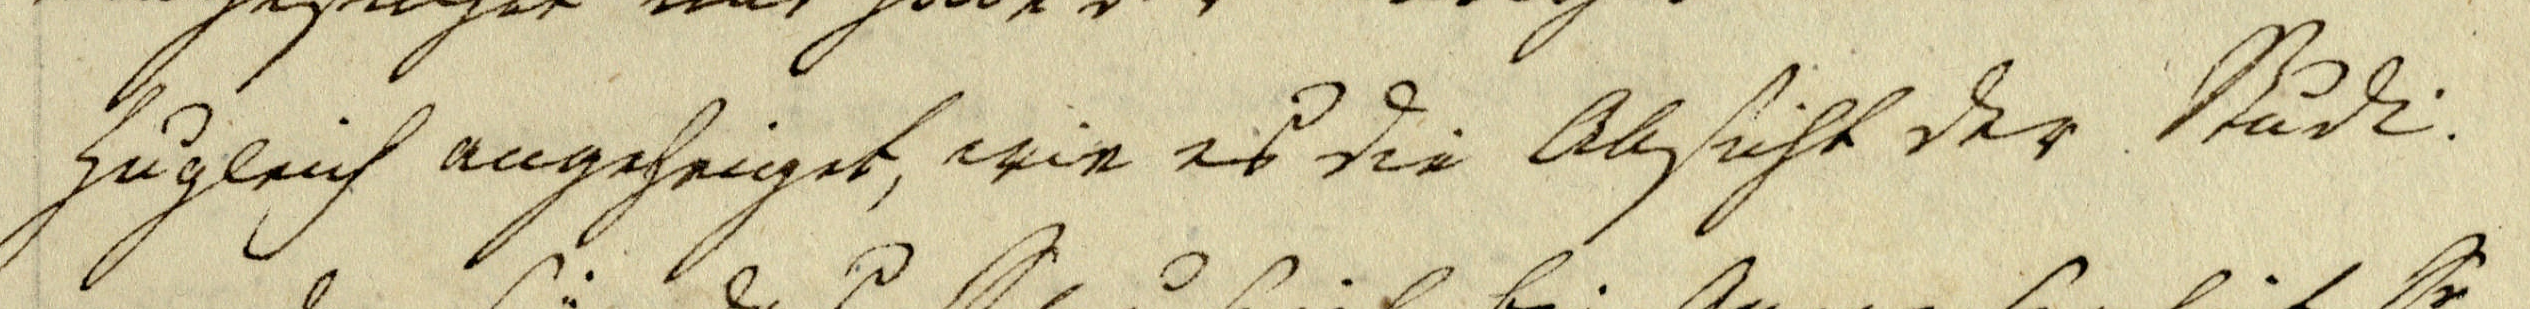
zugleich angezeiget, wie es die Absicht der Studi¬
